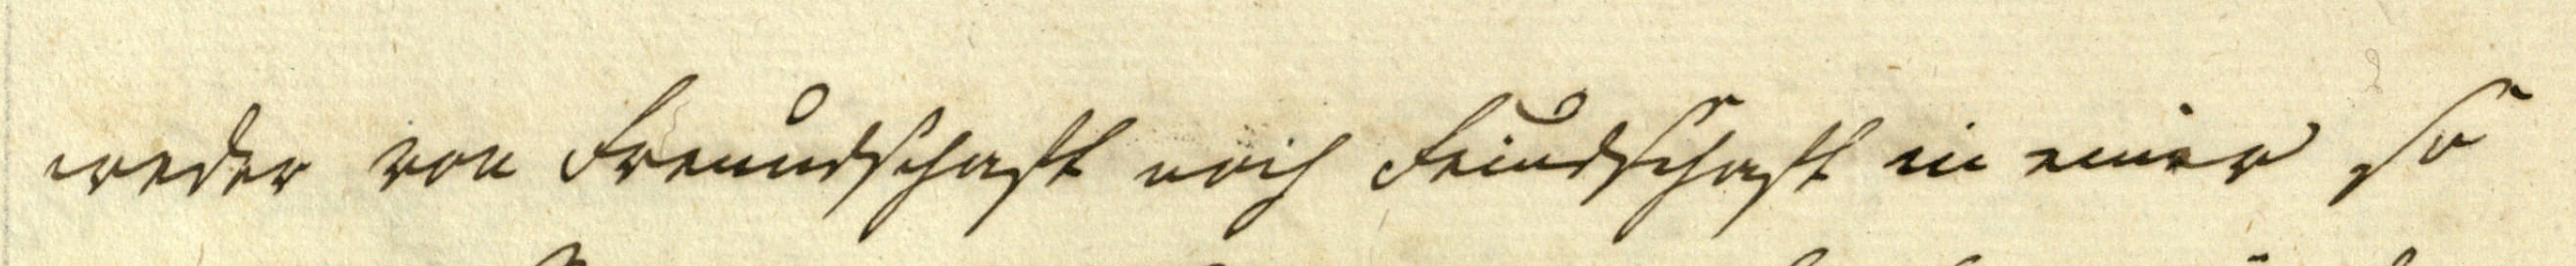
weder von Freundschaft noch Feindschaft in einer so
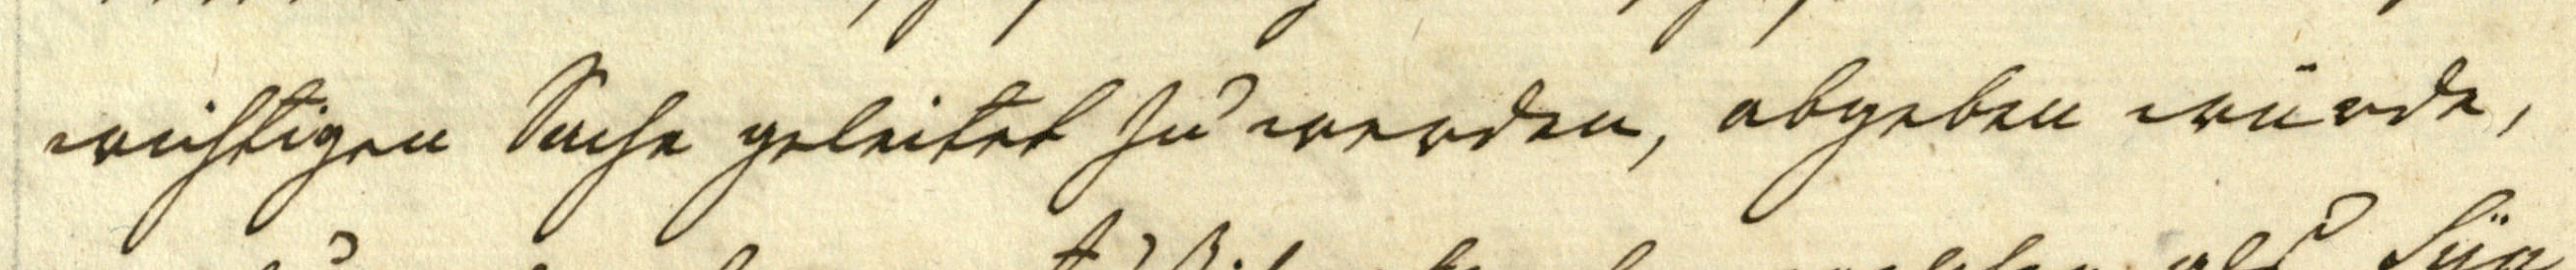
wichtigen Sache geleitet zu werden, abgeben würde,
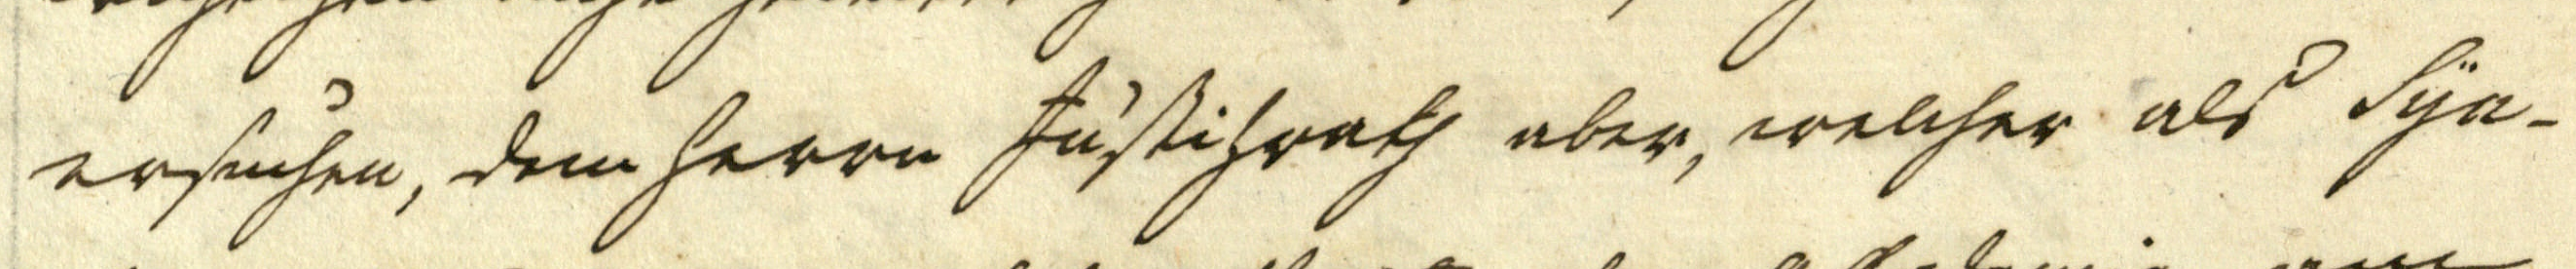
ersuchen, dem Herrn Justizrath aber, welcher als Sÿn¬
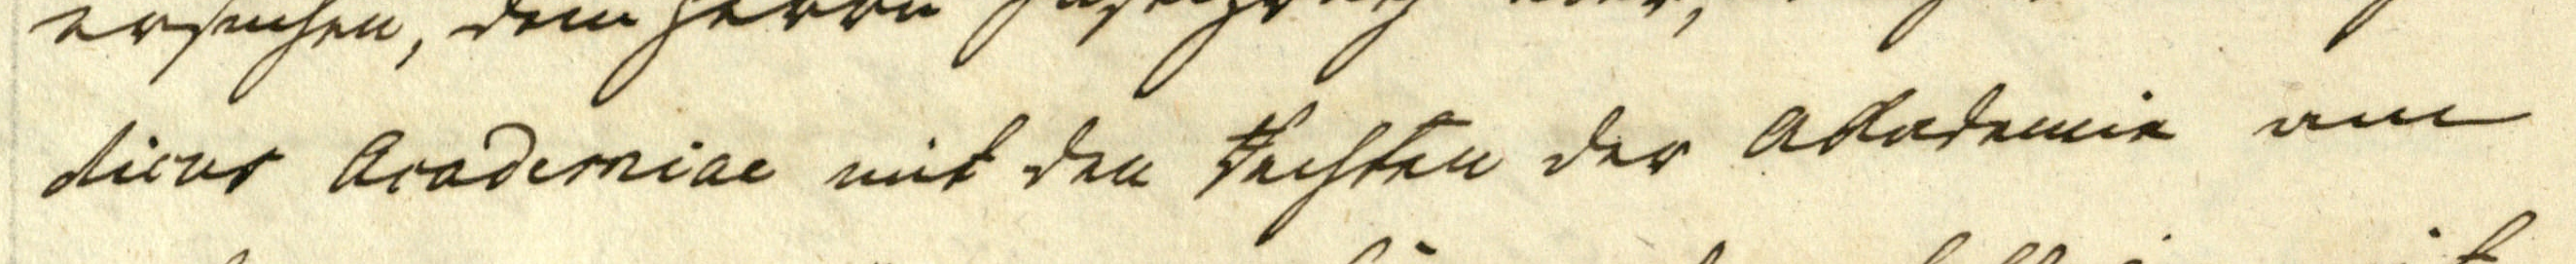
dicus Academiae mit den Rechten der Akademie am
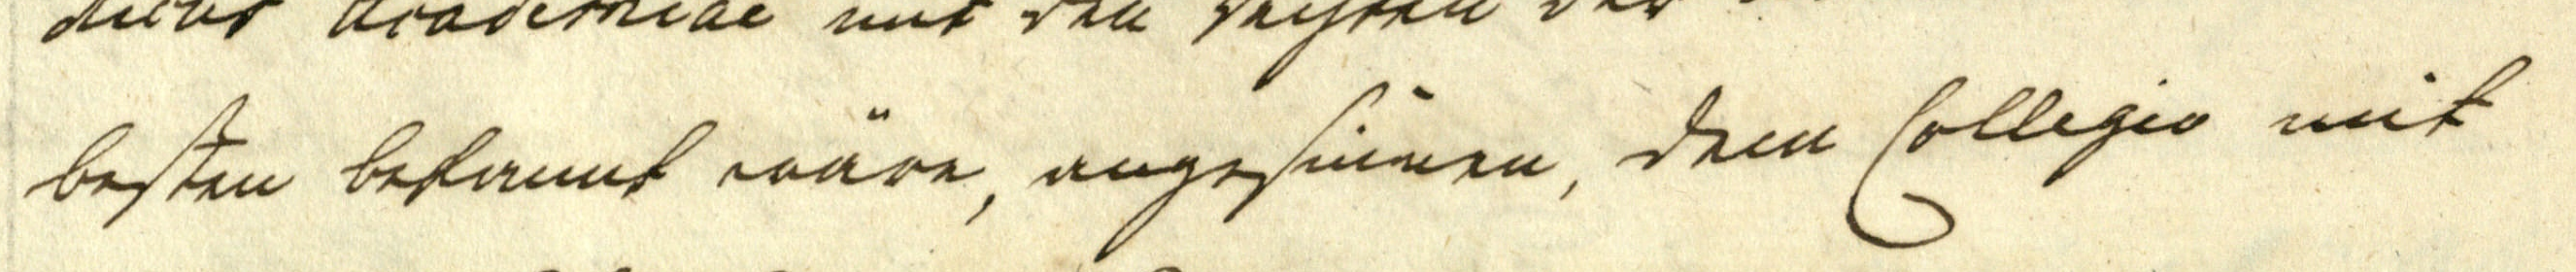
besten bekannt wäre, angesinnen, dem Collegio mit
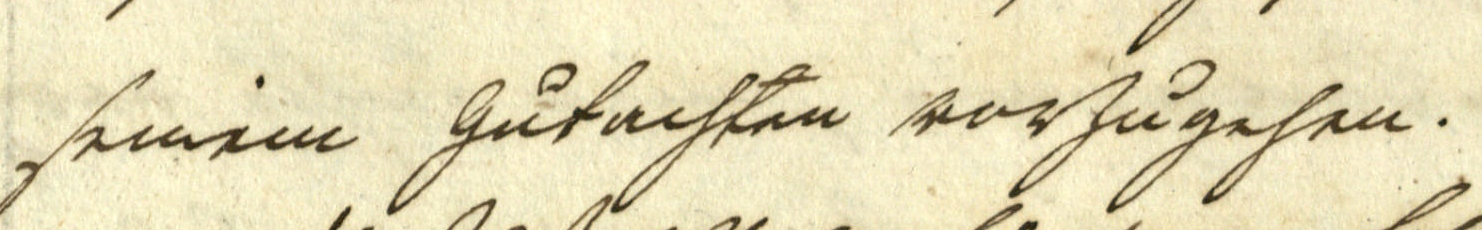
seinem Gutachten vorzugehen.
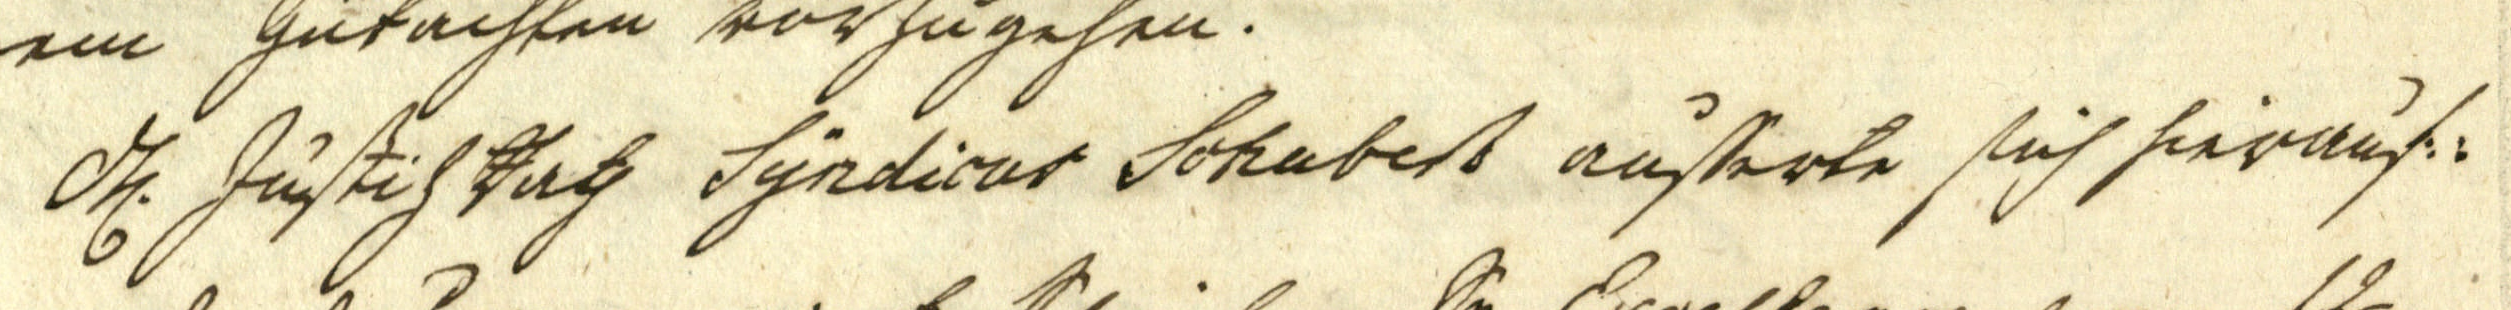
dh. Justiz Rath Sÿndicus Schubert äusserte sich hierauf:
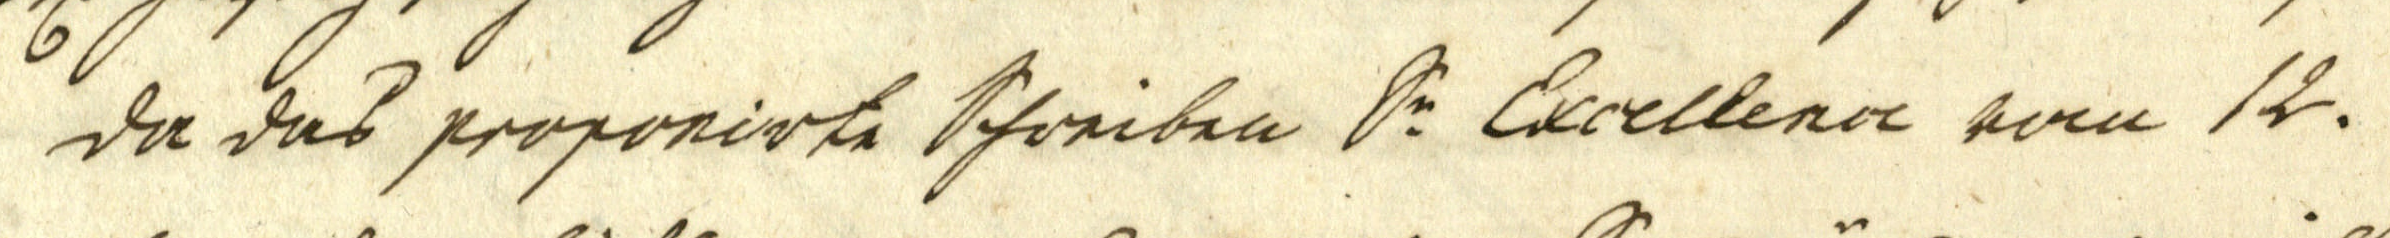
da das proponirte Schreiben Sr Excellence vom 12.
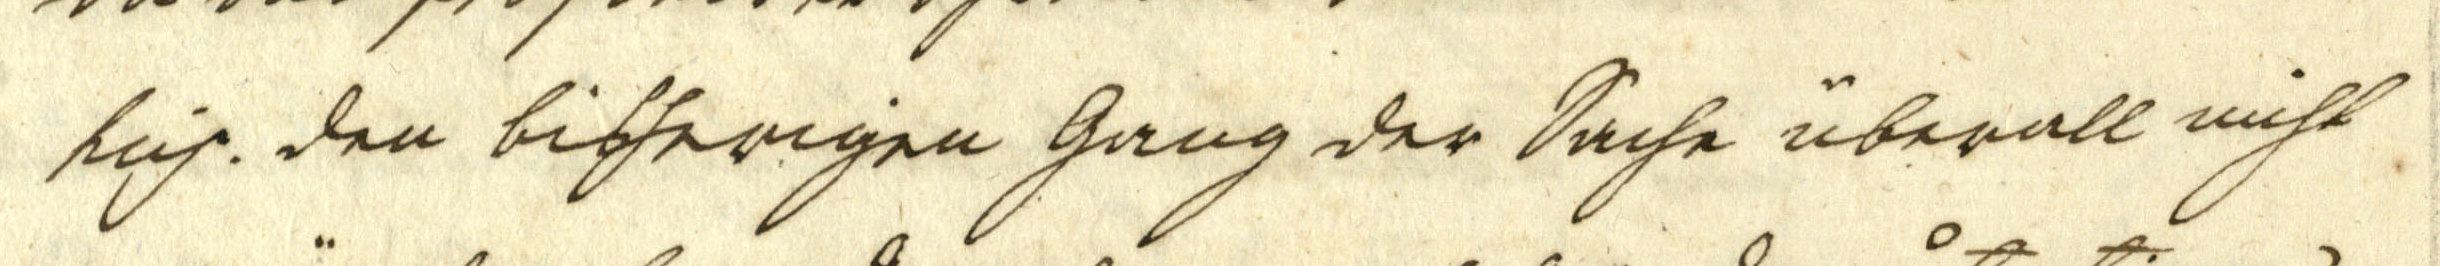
huj. den bisherigen Gang der Sache überall nicht
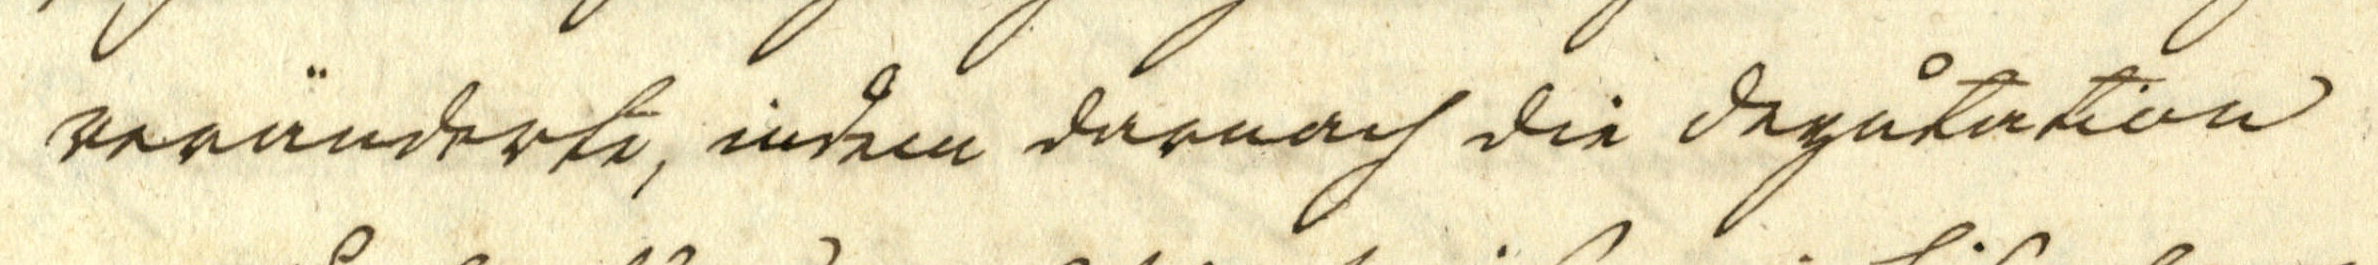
veränderte, indem darnach die Deputation
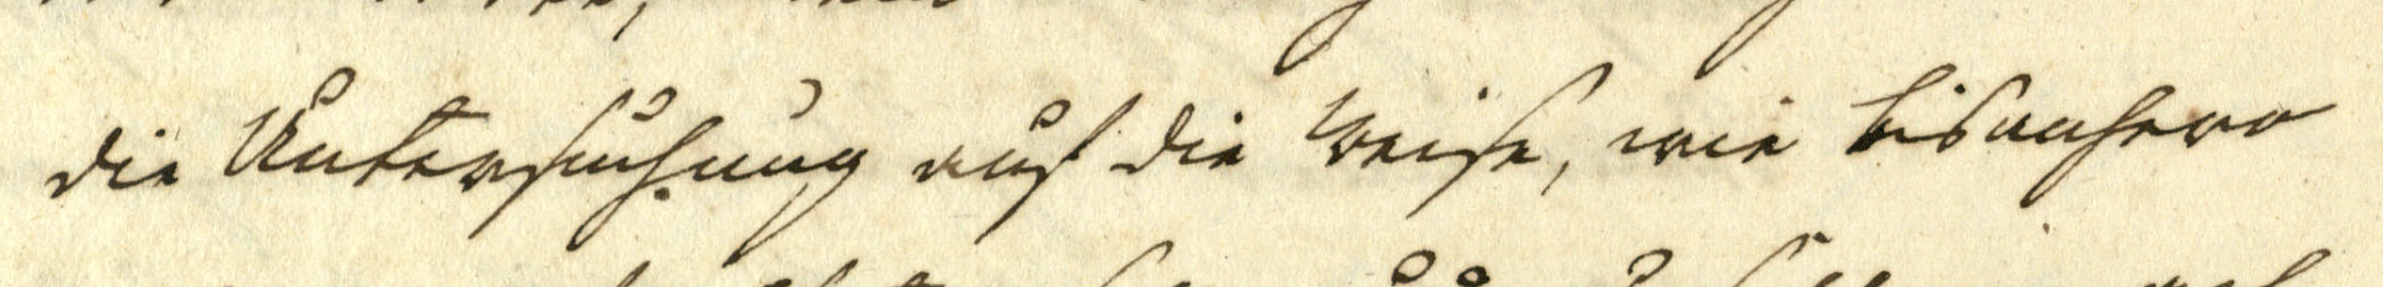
die Untersuchung auf die Weise, wie bisanhero
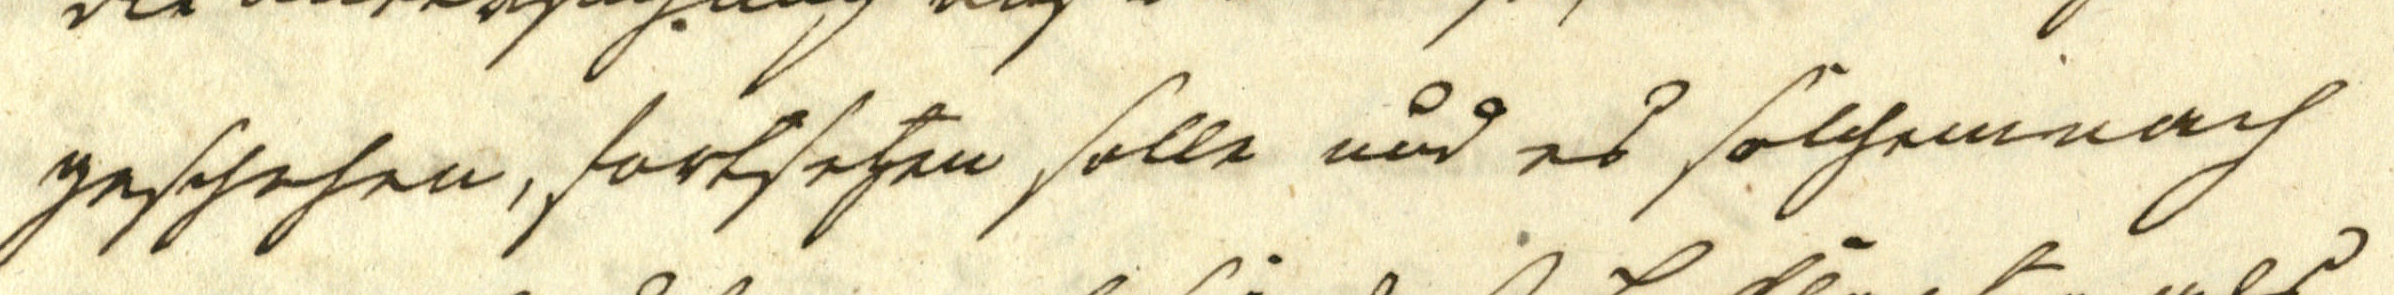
geschehen, fortsetzen solle und es solchemnach
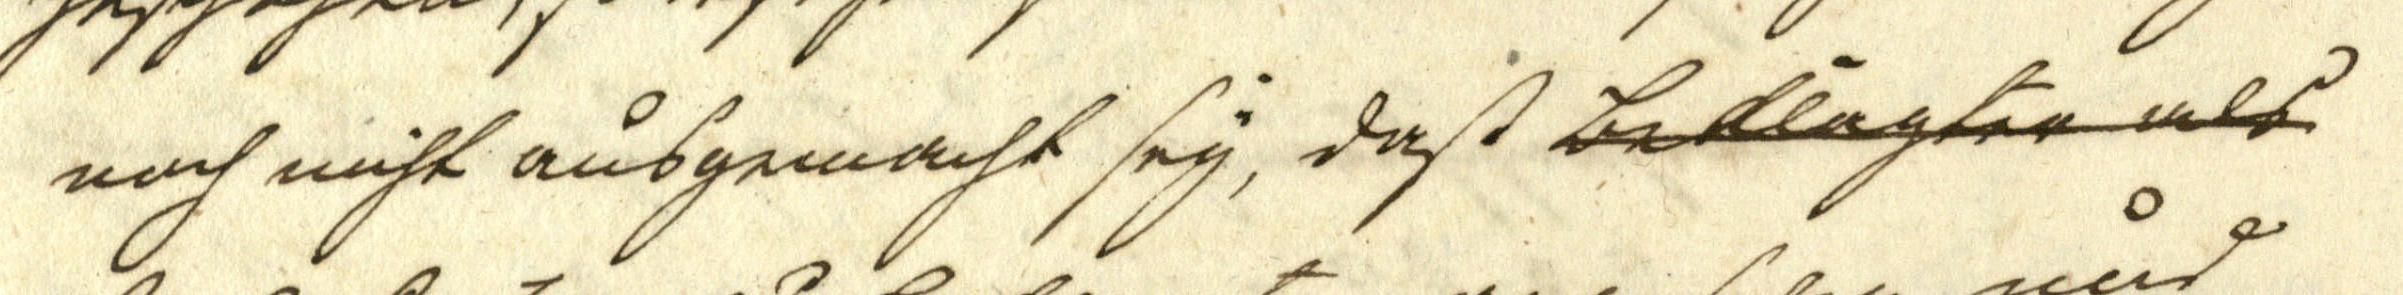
noch nicht ausgemacht seÿ, daß Beklagter als
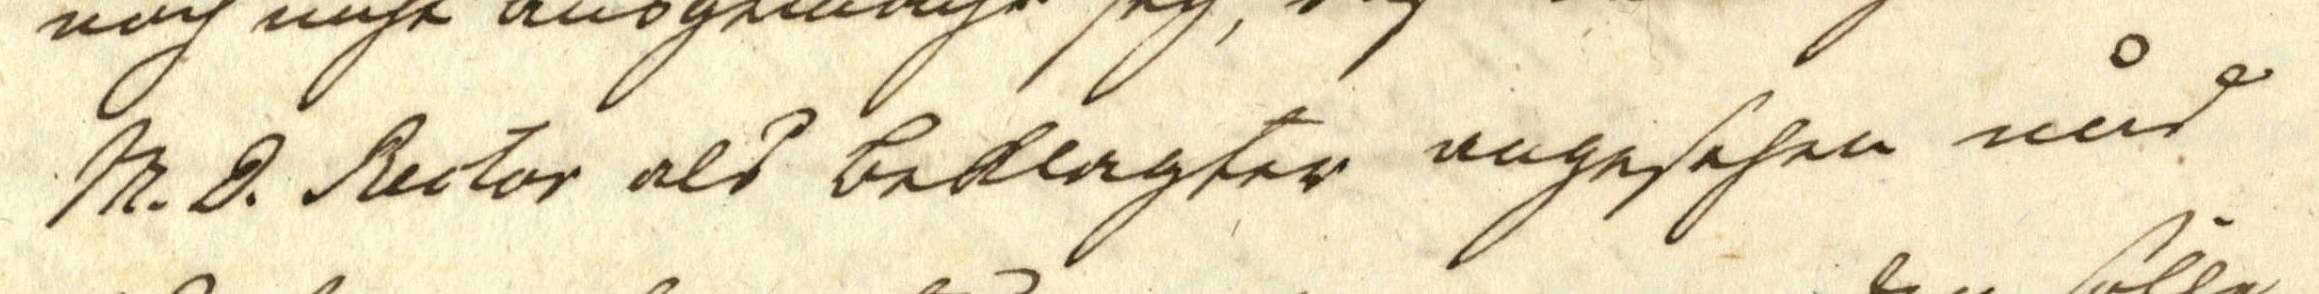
M. D. Rector als Beklagter angesehen und
